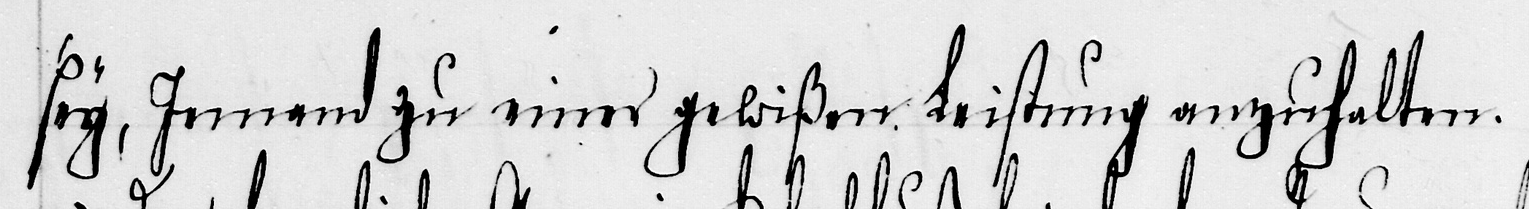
sey, Jemand zu einer gewißen Leistung anzuhalten.
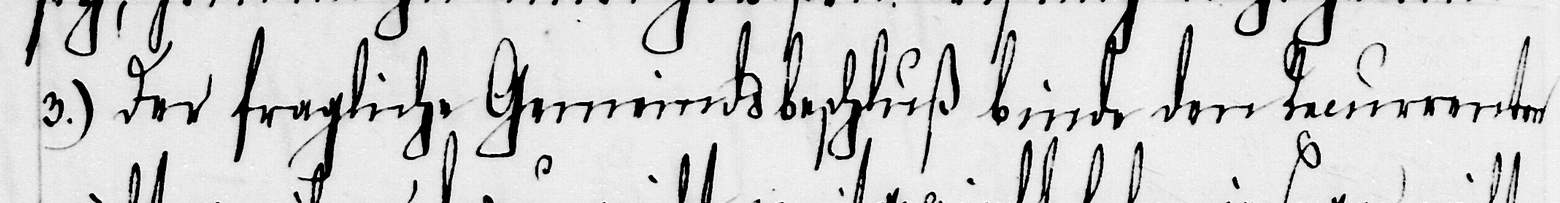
3.) Der fragliche Gemeindsbeschluß binde den Recurrenten
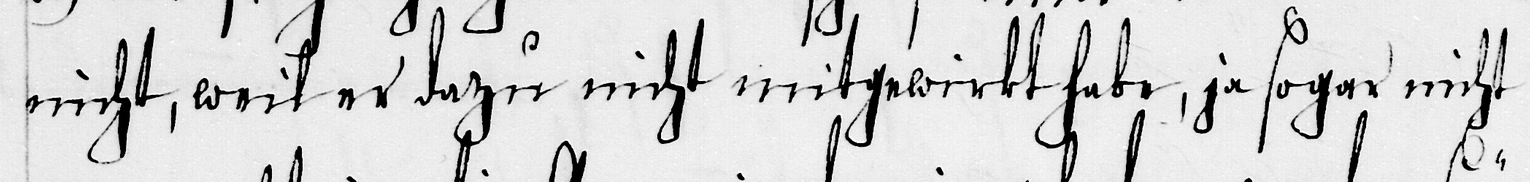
nicht, weil er dazu nicht mitgewirkt habe, ja sogar nicht
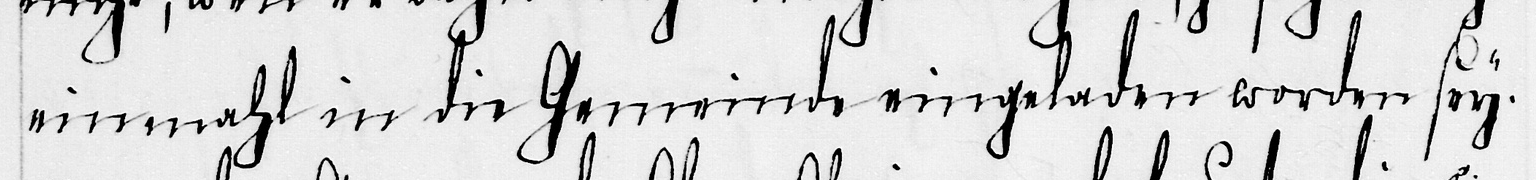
einmahl in die Gemeidne eingeladen worden sey.
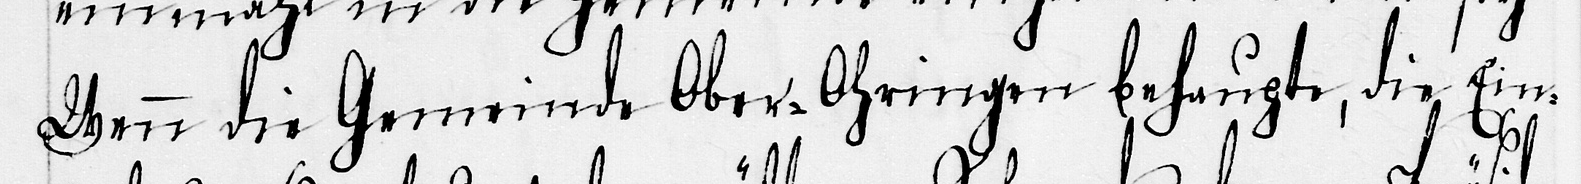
Wenn die Gemeinde Ober-Ohringen behaupte, die Ein¬
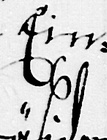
des
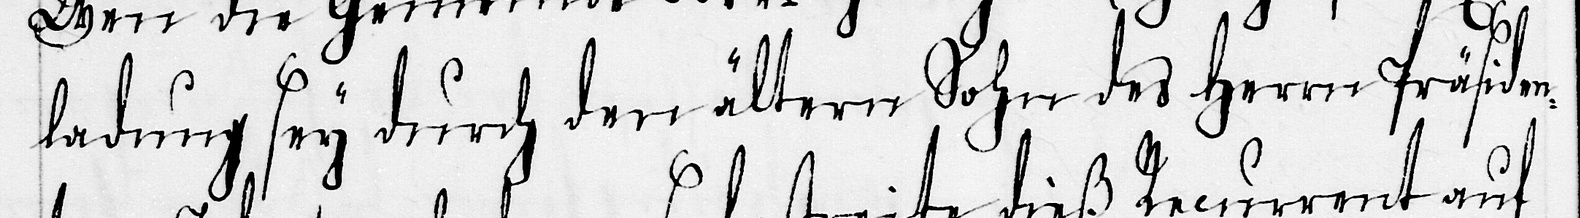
ladung sey durch den ältern Sohn des Herrn Präside¬
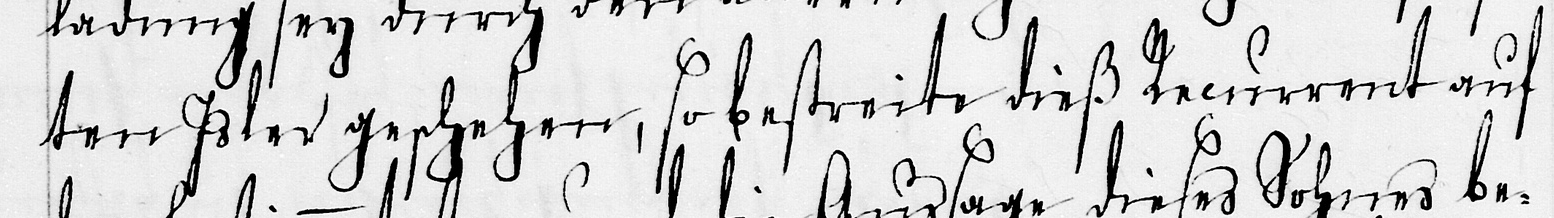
nten Isler geschehen, so bestreite dieß Recurrent auf
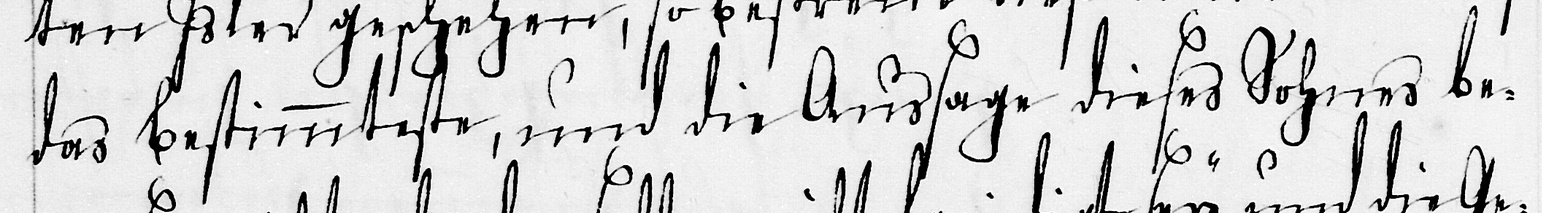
das Bestimmteste, und die Aussage dieses Sohnes be¬
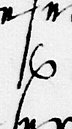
so
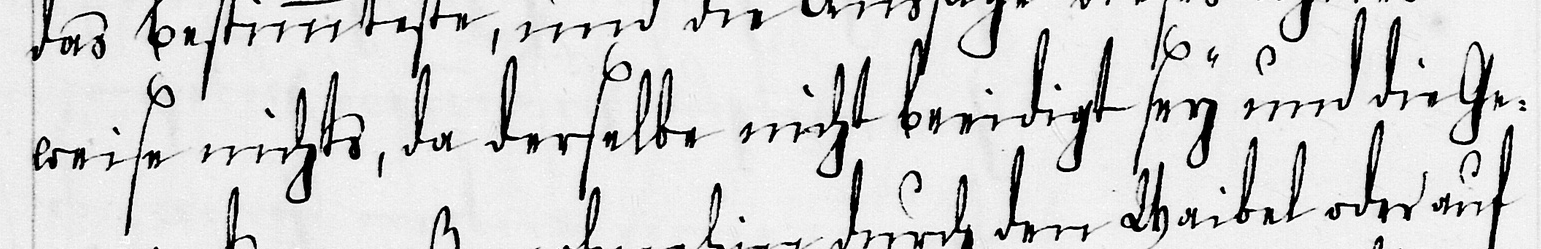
weise nichts, da derselbe nicht beeidigt sey und die Ge¬
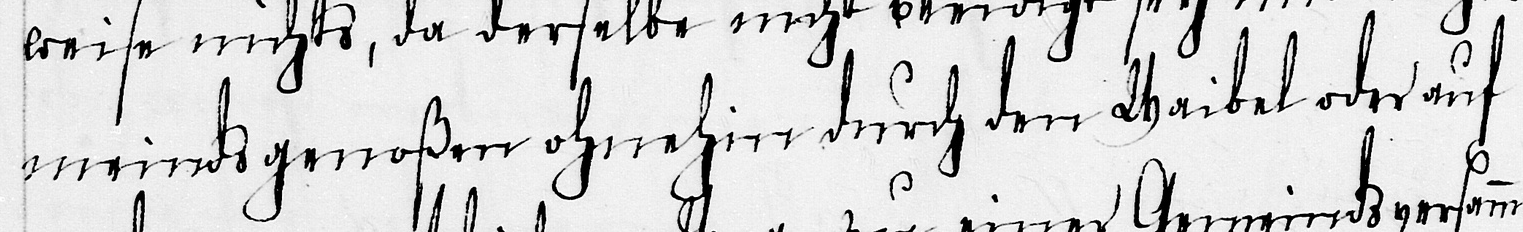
meindsgenoßen ohnehin durch den Waibel oder auf
